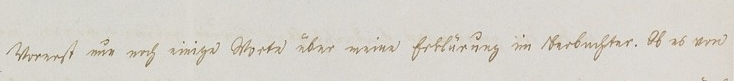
Vorerst nur noch einige Worte über meine Erklärung im Beobachter. Ob es von
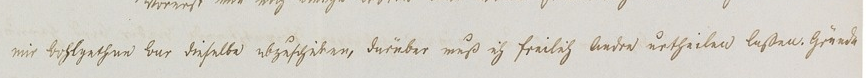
mir wohlgethan war dieselbe abzuschicken, darüber muß ich freilich Andre urtheilen laßen, Gründe
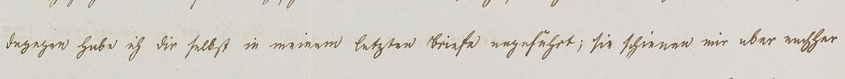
dagegen habe ich dir selbst in meinem letzten Briefe angeführt; sie schienen mir aber nachher
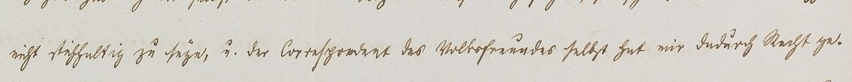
nicht stichhaltig zu seyn, u. der Correspondent des Volksfreundes selbst hat mir dadurch Recht ge-
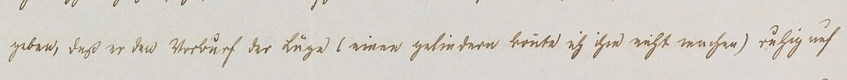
geben, daß er den Vorwurf der Lüge (einen gelindern konnte ich ihm nicht machen) ruhig auf
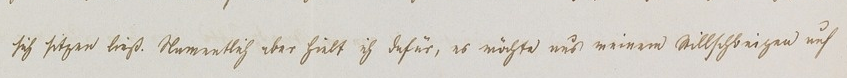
sich sitzen ließ. Namentlich aber hielt ich dafür, es möchte aus meinem Stillschweigen auf
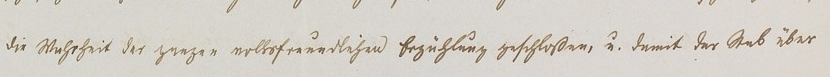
die Mehrheit der ganzen volksfreundlichen Erzählung geschloßen, u. damit der Stab über
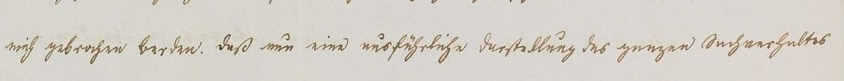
mich gebrochen werden. Daß nun eine ausführliche Darstellung des ganzen Sachverhaltes
